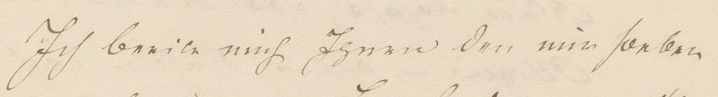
Ich beeile mich Ihnen den mir soeben
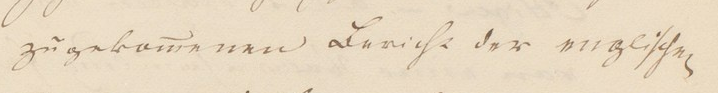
zugekommenen Bericht der englischen
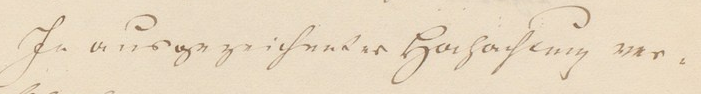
In ausgezeichneter Hochachtung ver-
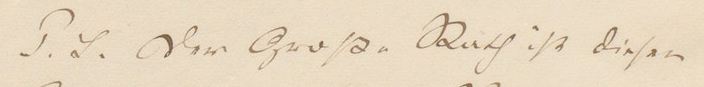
P. S. Der Große Rath ist diesen
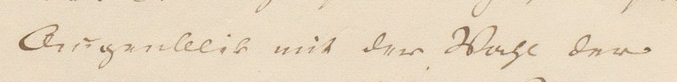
Augenblik mit der Wahl der
